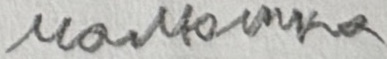малютка
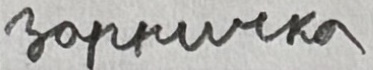зарничка
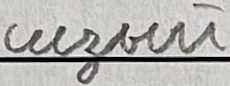сизый
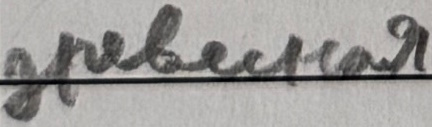древесная
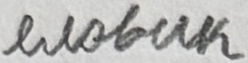еловик
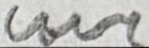сыч
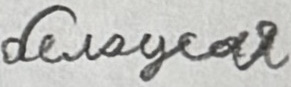белоусая
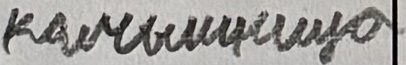камышница
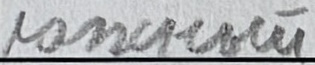южный
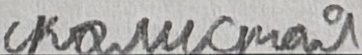скалистая
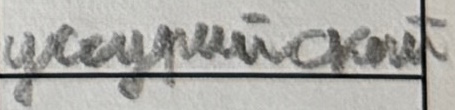уссурийский
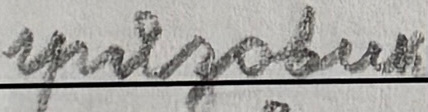грязовик
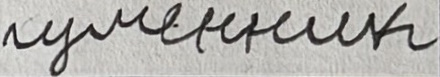гуменник
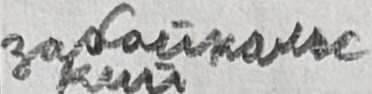забайкальский
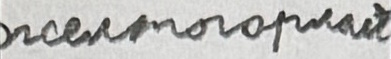желтогорлая
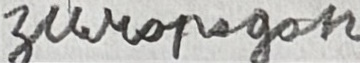зимородок
